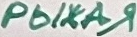рыжая
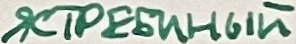ястребиный
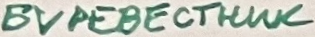буревестник
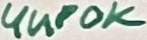чирок
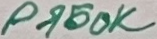рябок
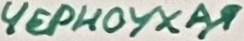черноухая
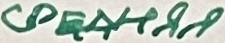средняя
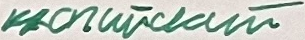каспийский
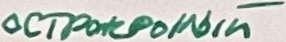острокрылый
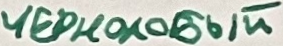чернолобый
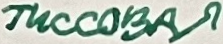тиссовая
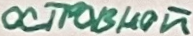островной
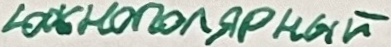южнополярный
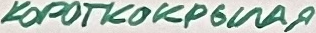короткокрылая
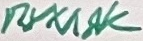пухляк
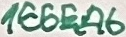лебедь
